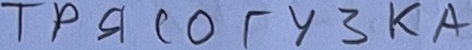трясогузка
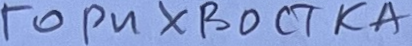горихвостка
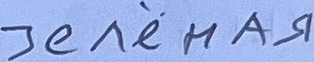зелёная
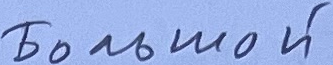большой
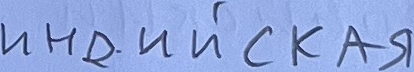индийская
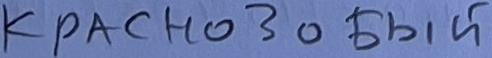краснозобый
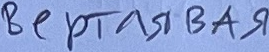вертлявая
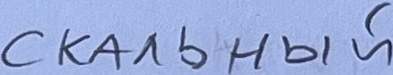скальный
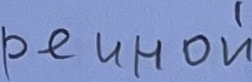речной
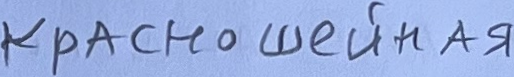красношейная
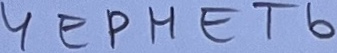чернеть
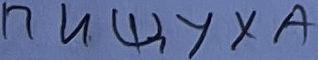пищуха
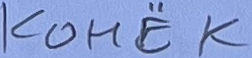конёк
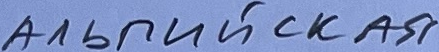альпийская
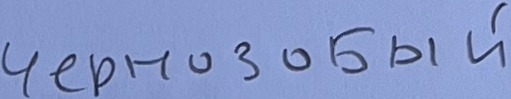чернозобый
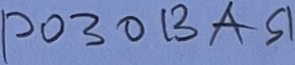розовая
